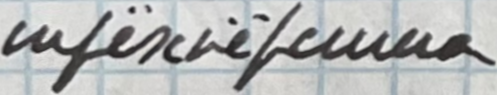трёхпёрстка
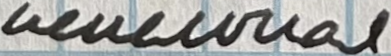пепельная
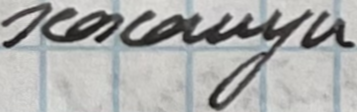хохотун
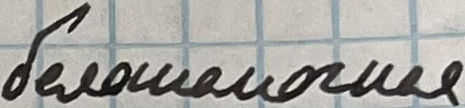белошапочная
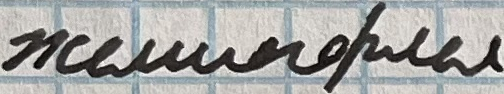желтогорлая
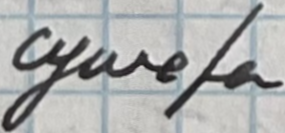сутора
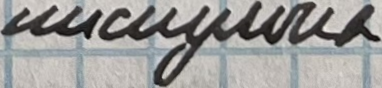пискулька
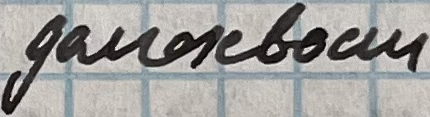долгохвост
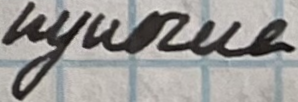пуночка
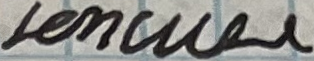южная
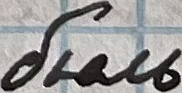бюль
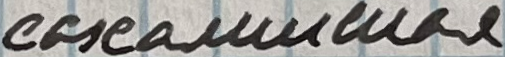сахалинская
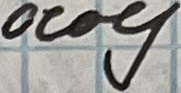осоед
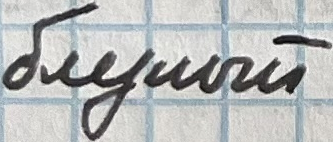бледный
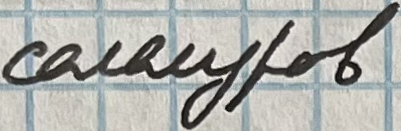соландров
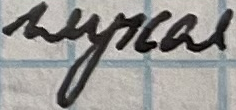глухая
